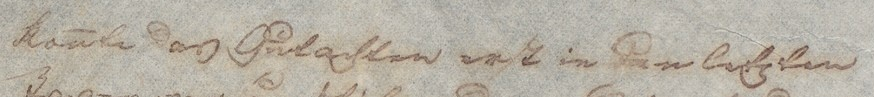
konnte das Gutachten erst in den letzten
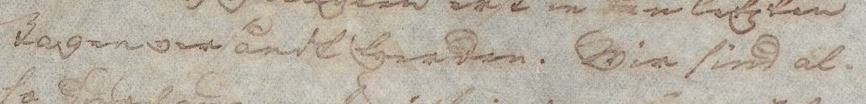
Tagen versandt werden. Wir sind al-
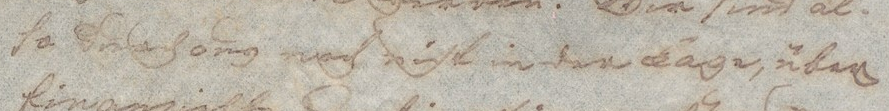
so durchaus noch nicht in der Lage, über
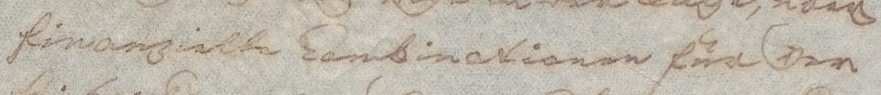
finanzielle Combinationen für Ver-
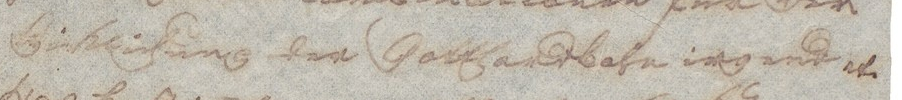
wirklichung der Gotthardbahn irgend et-
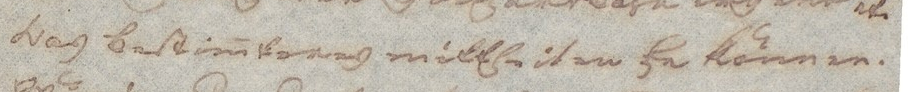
was bestimmteres mittheilen zu können.
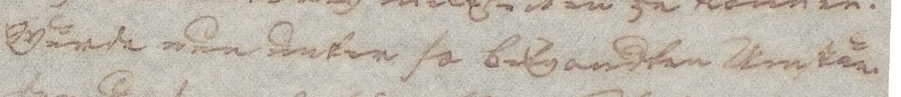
Würde nun unter so bewandten Umstän-
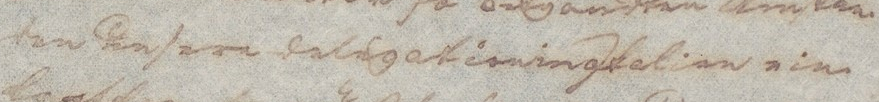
den unsere Delegation in Italien ein-
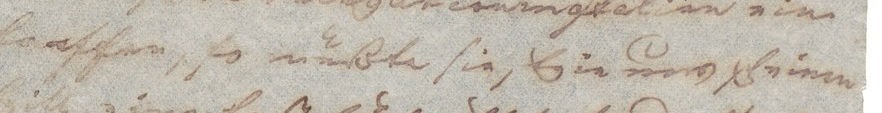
treffen, so müßte sie, wie uns scheinen
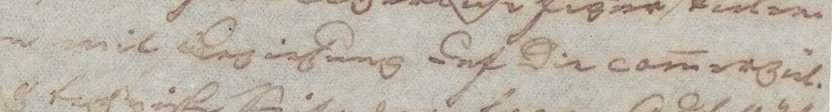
Um mit Beziehung auf die commerziel-
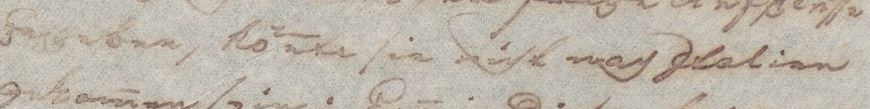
zu geben, könnte sie nicht nach Italien
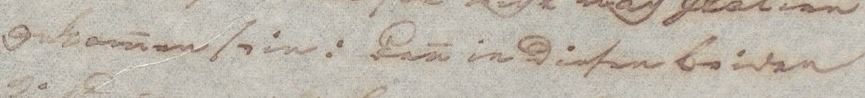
gekommen sein: Denn in diesen beiden
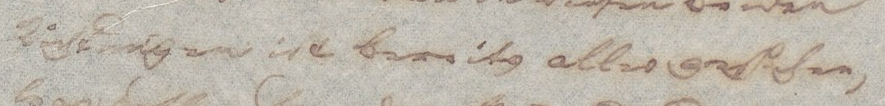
Richtungen ist bereits alles geschehen,
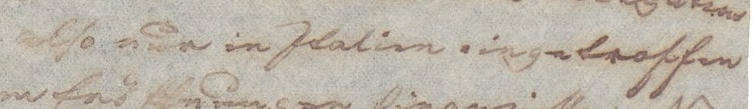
also nur in Italien eingetroffen
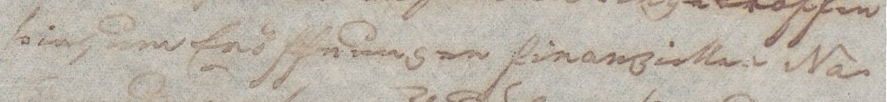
sein, um Eröffnungen finanzieller Na-
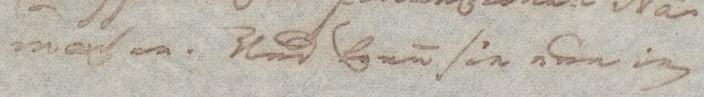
zu machen. Und wenn Sie nun in
